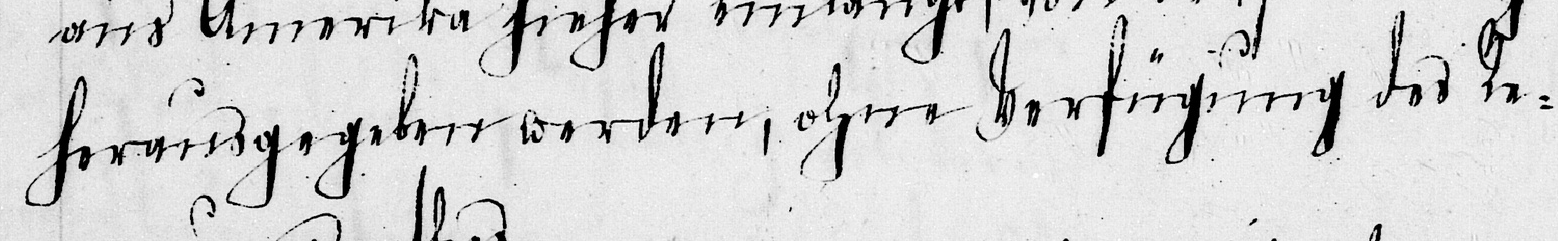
herausgegeben werden, ohne Verfügung des Re¬
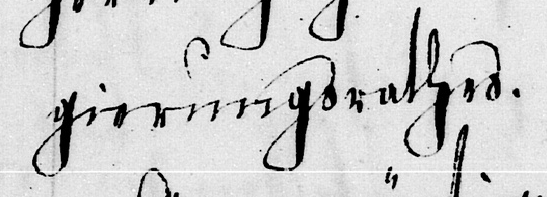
gierungsrathes.
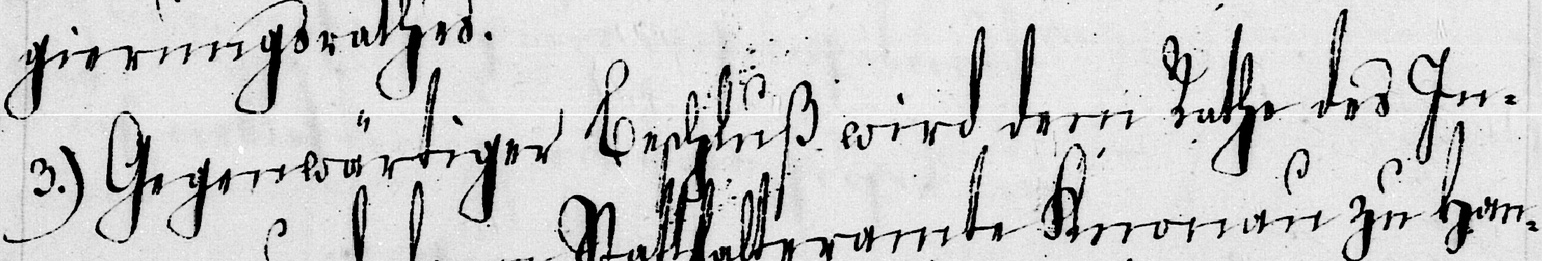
3.) Gegenwärtiger Beschluß wird dem Rathe des In¬
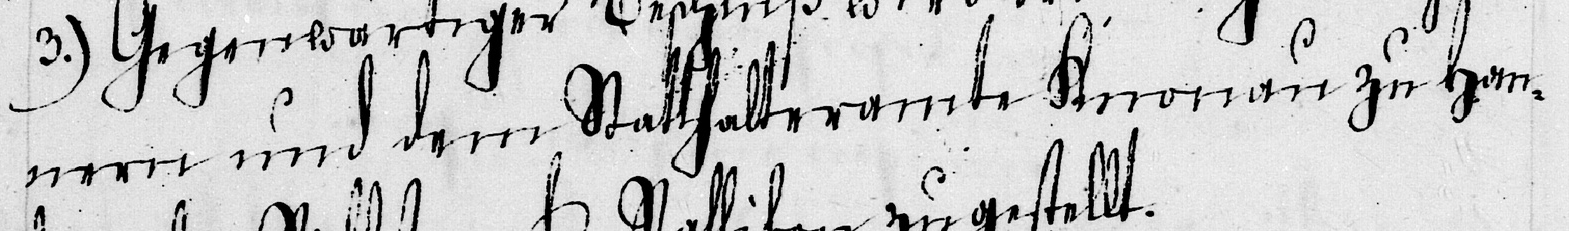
nern und dem Statthalteramte Knonau zu Han¬
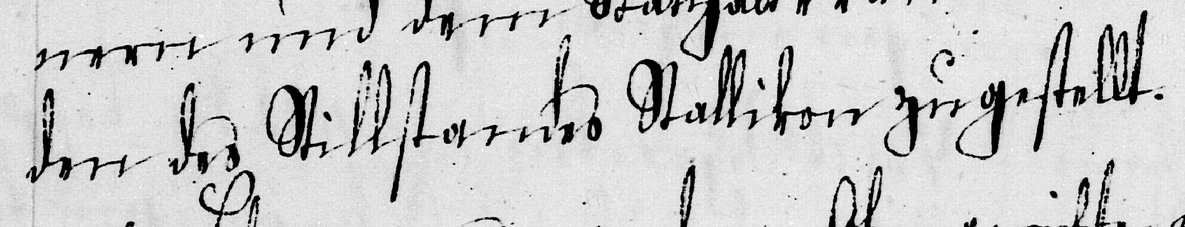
den des Stillstandes Stallikon zugestell¬
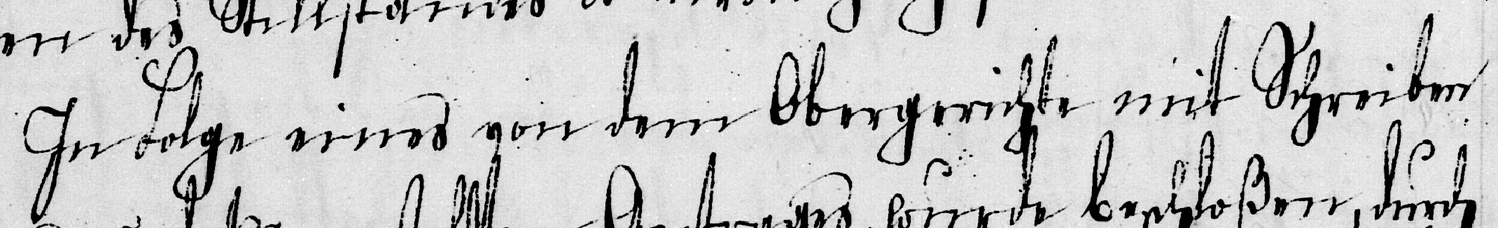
In Folge eines von dem Obergerichte mit Schreiben
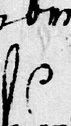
t.
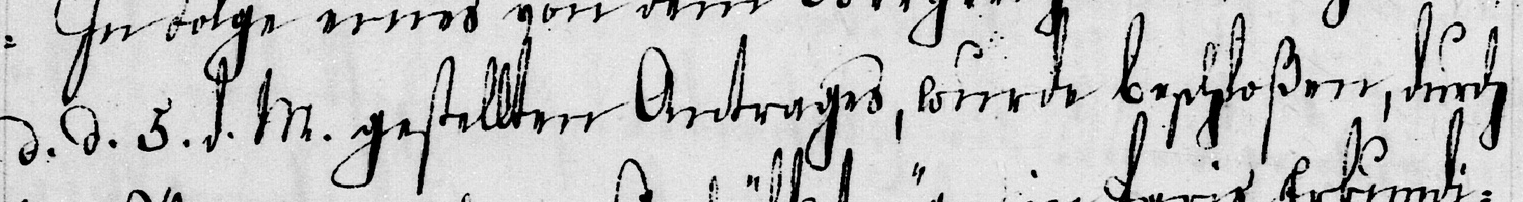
d. d. 5. d. M. gestellten Antrages, wurde beschloßen, durch
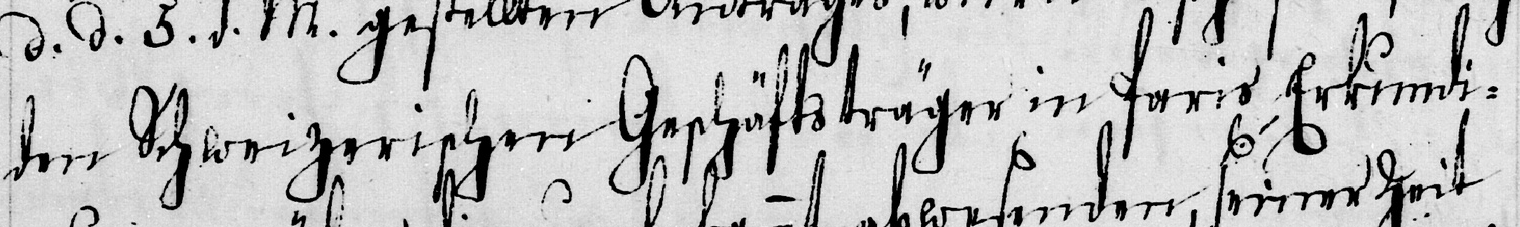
den Schweizerischen Geschäftsträger in Paris Erkundi¬
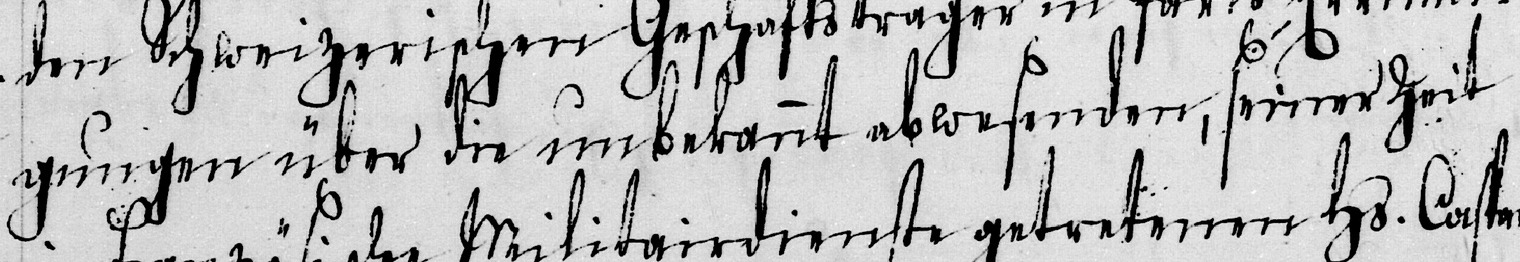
gungen über die unbekannt abwesenden, seiner Zeit
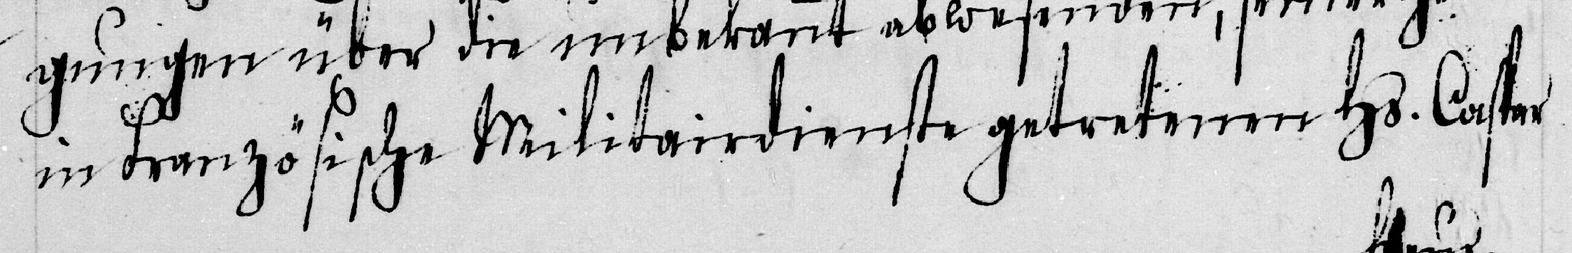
in Französische Militairdienste getretenen Hs. Caspar
